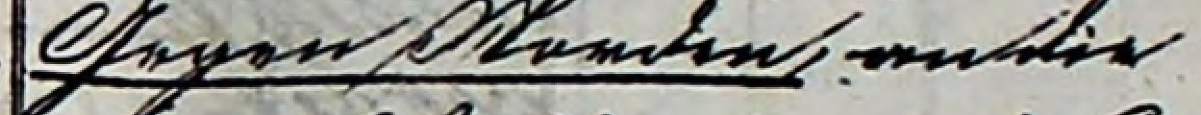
Gegen Norden, an die
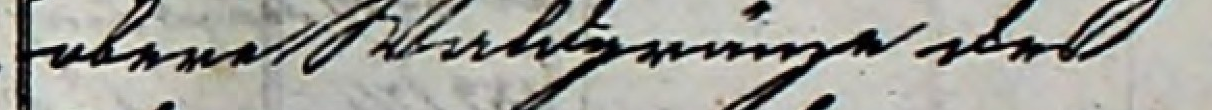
obere Waldgränze des
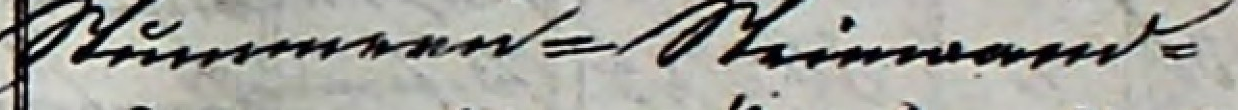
Stummern = Steinwand =
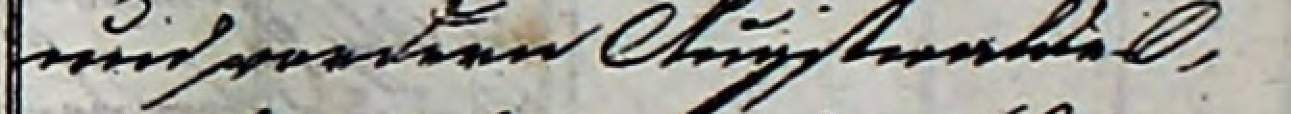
und vordern Augstwaldes,
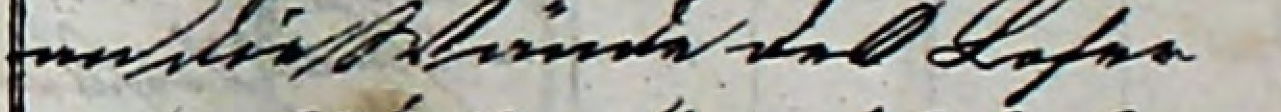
an die Wände des Loher
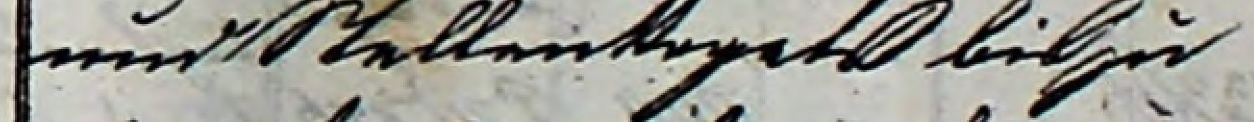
und Stellenkopets bis zu
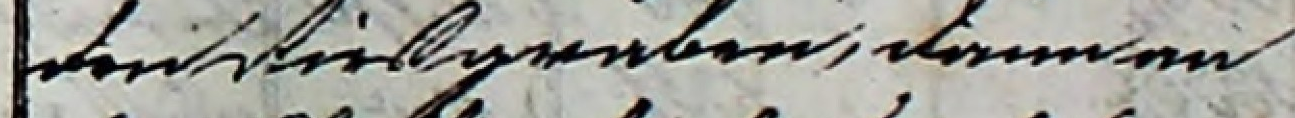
den dies graben, dann an
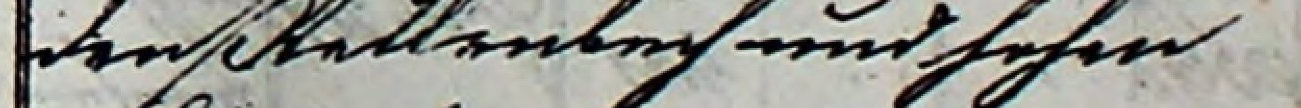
den Rettenbech und hohen
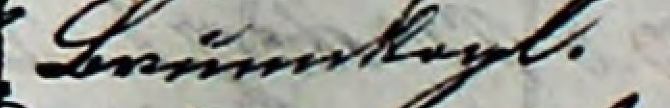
Brunnkogl.
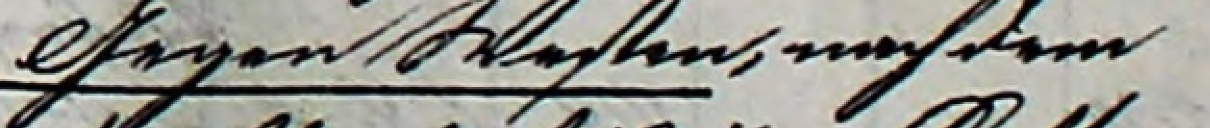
Gegen Westen, nach dem
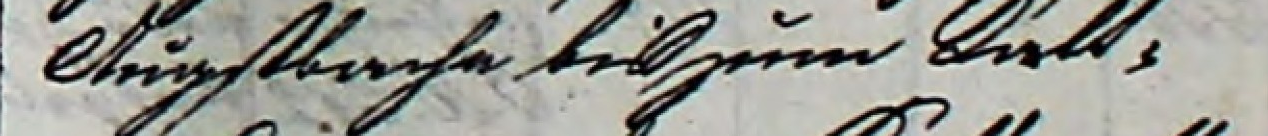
Augstbache bis zum Kalt„
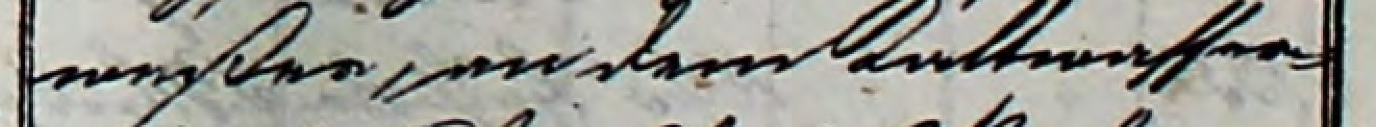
waßer, an dem Kaltwasser=
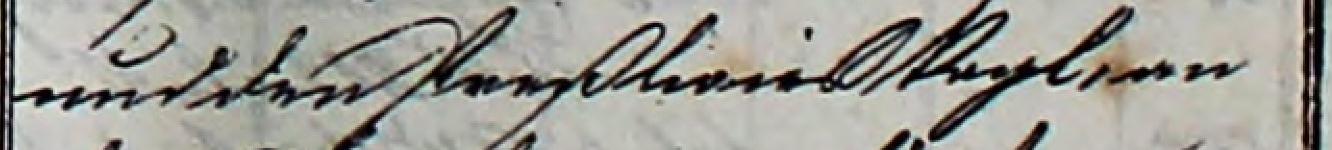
und den Preßlwirs kogl, an
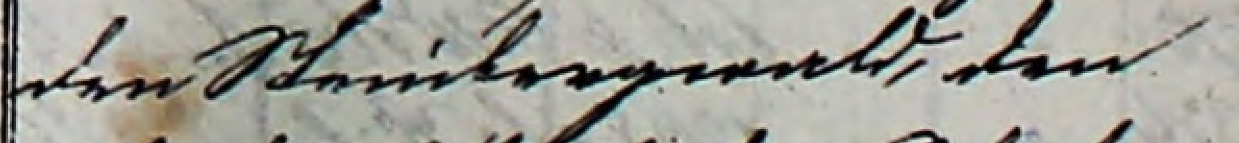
den Steinbergwald, den
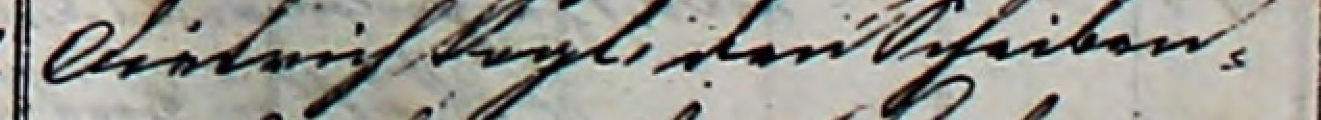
Dietrich kogl, den Scheiben„
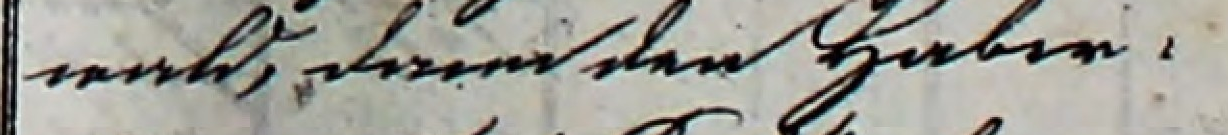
wald, dann den Haber„
